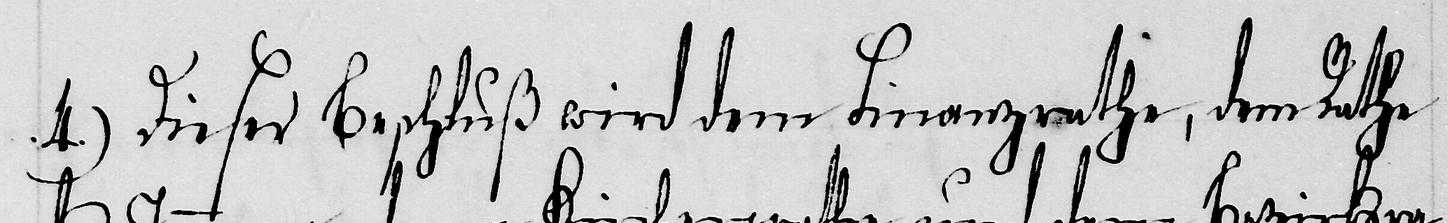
4.) Dieser Beschluß wird dem Finanzrathe, dem Rathe
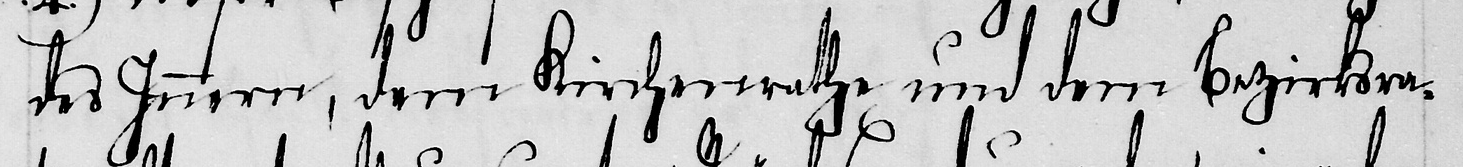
des Innern, dem Kirchenrathe und dem Bezirksra¬
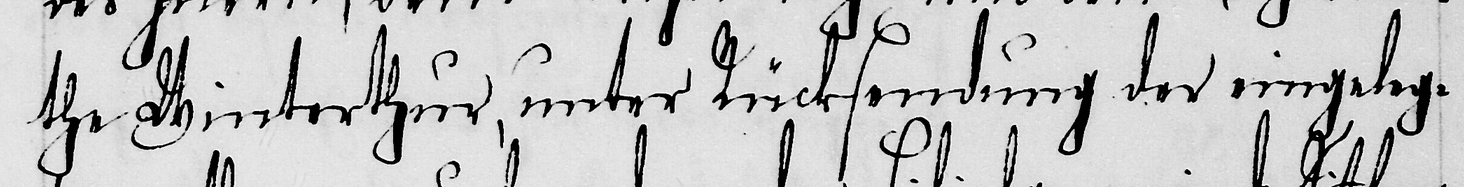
the Winterthur, unter Rücksendung der eingeleg¬
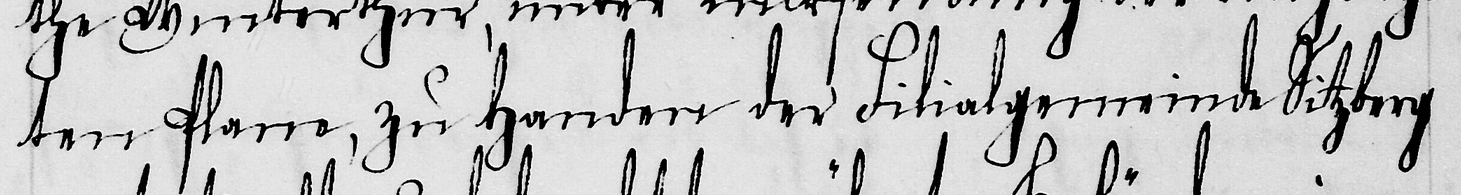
ten Plane, zu Handen der Filialgemeinde Sitzberg
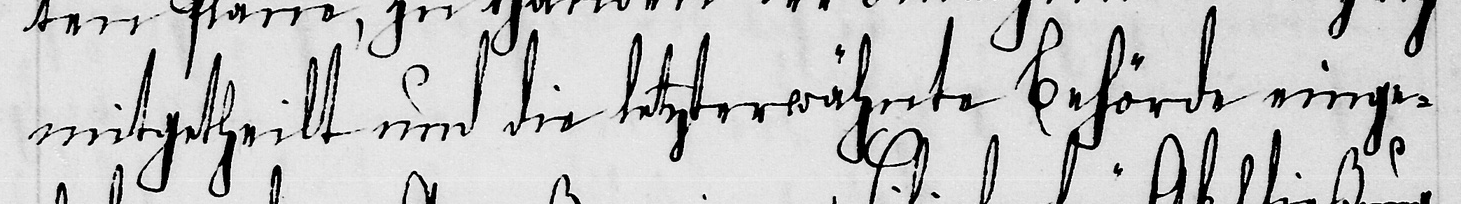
mitgetheilt und die letzterwähnte Behörde einge¬
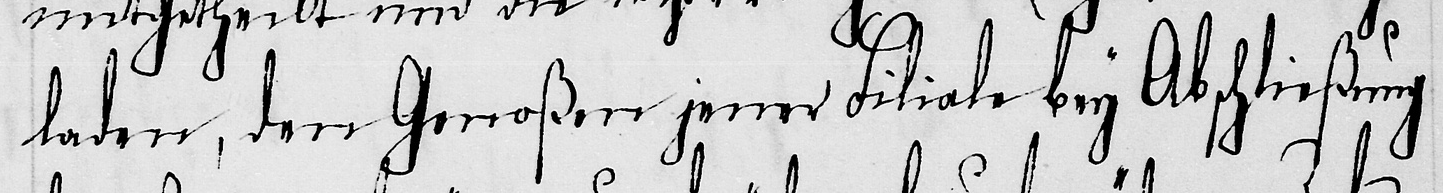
laden, den Genoßen jener Filiale bey Abschließung
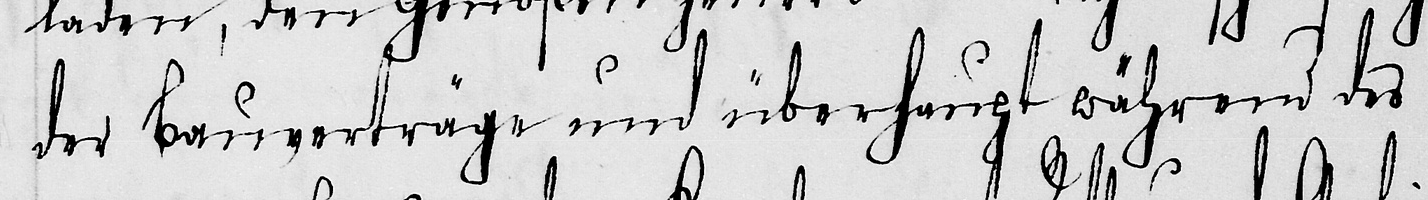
der Bauverträge und überhaupt während des
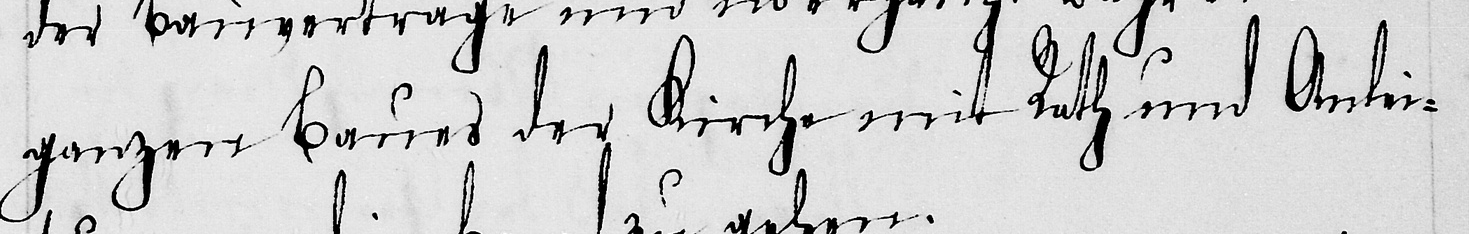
ganzen Baues der Kirche mit Rath und Anlei¬
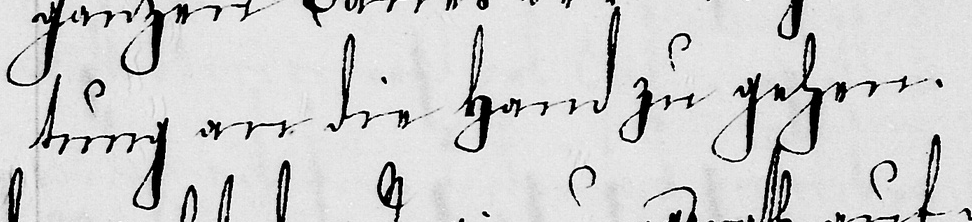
tung an die Hand zu geben.
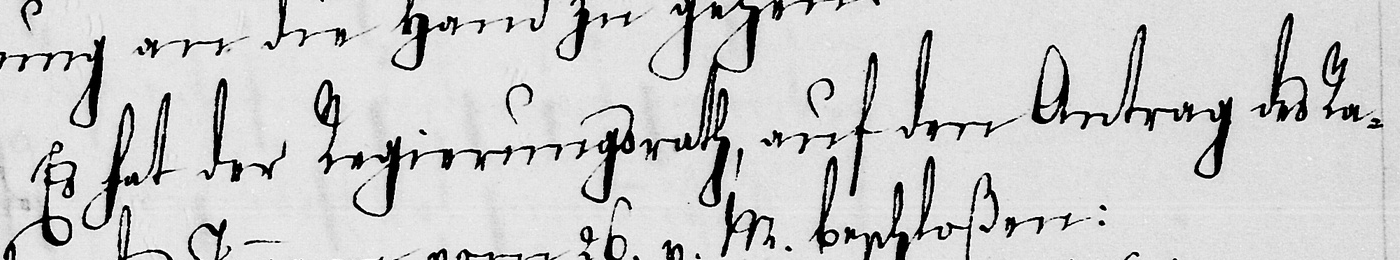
Es hat der Regierungsrath, auf den Antrag des R¬
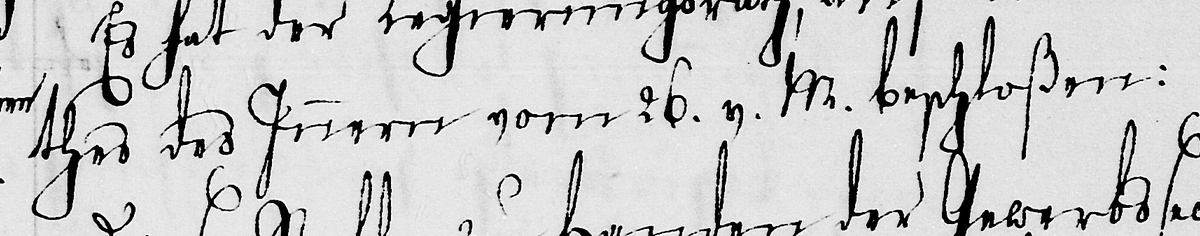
athes des Innern vom 26. v. M. beschloßen:
